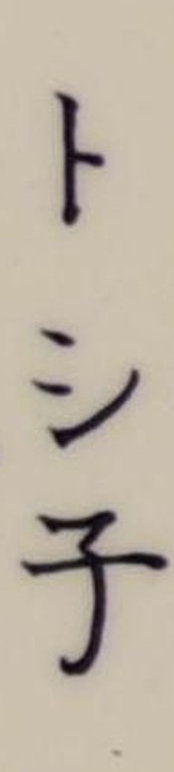トシ子

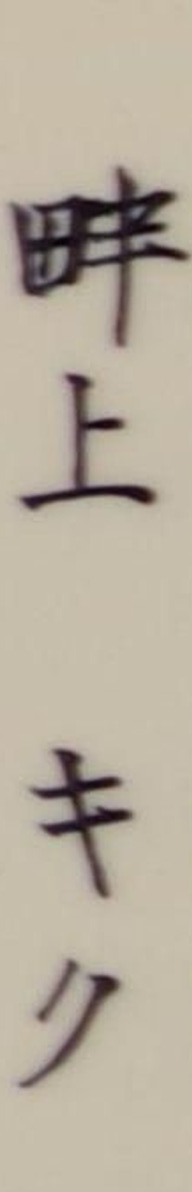畔上キク
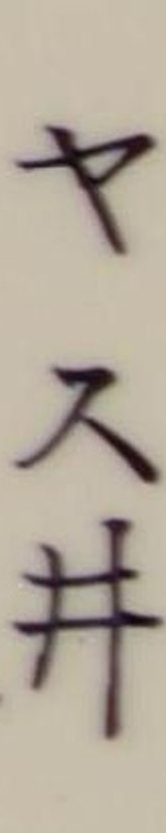ヤス井
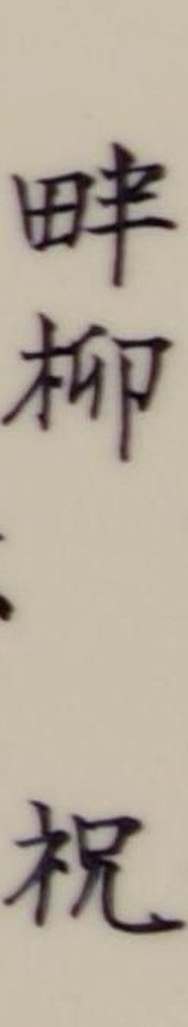畔柳祝
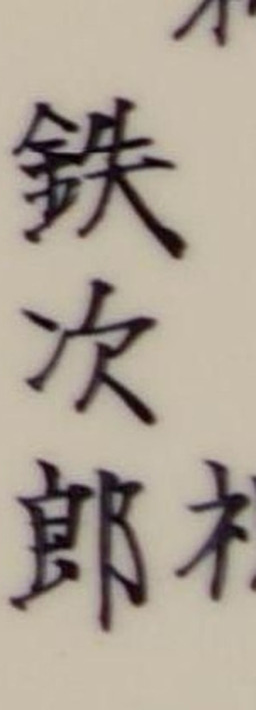鉄次郎
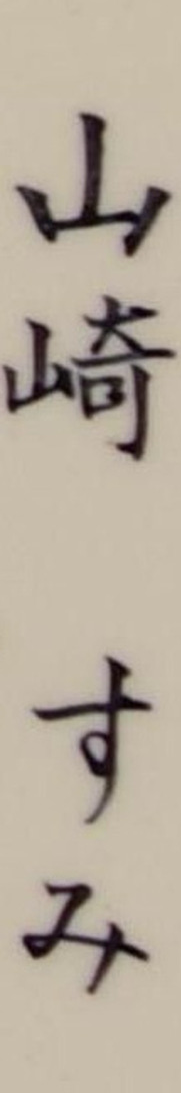山崎すみ
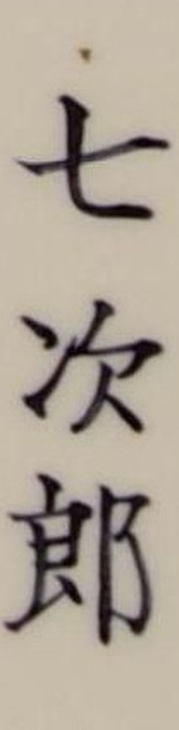七次郎
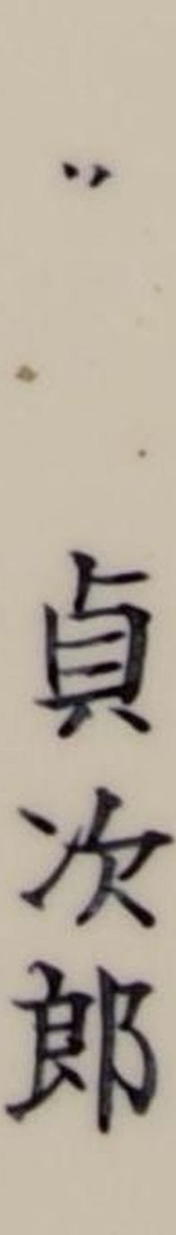貞次郎
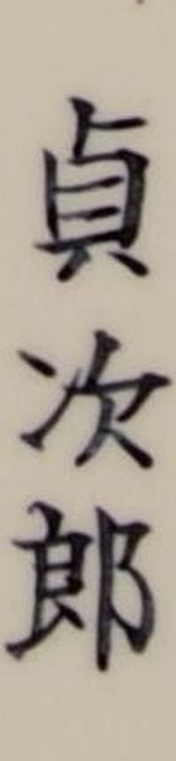貞次郎
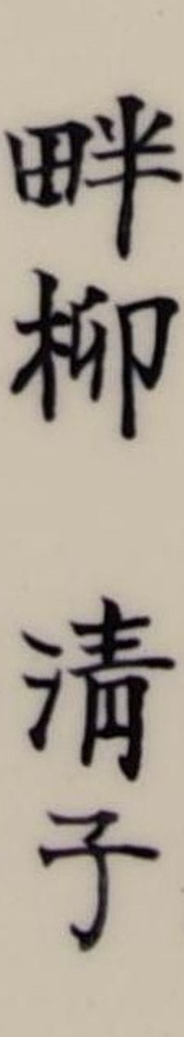畔柳清子
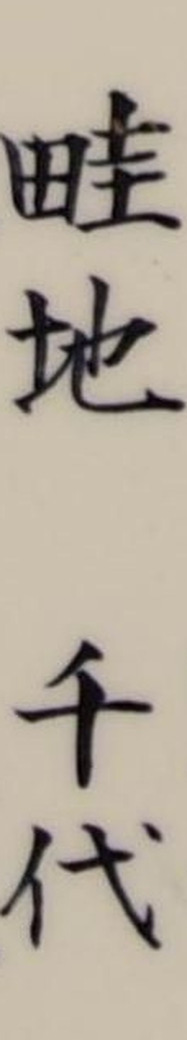畔地千代
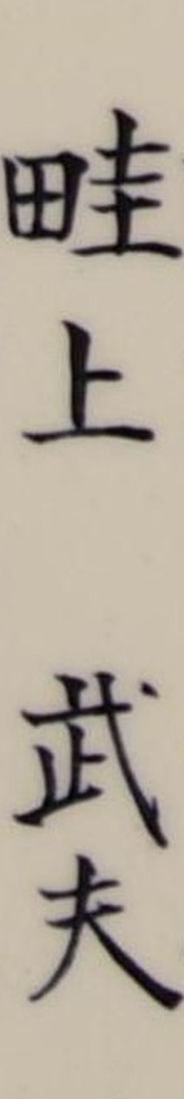畔上武夫
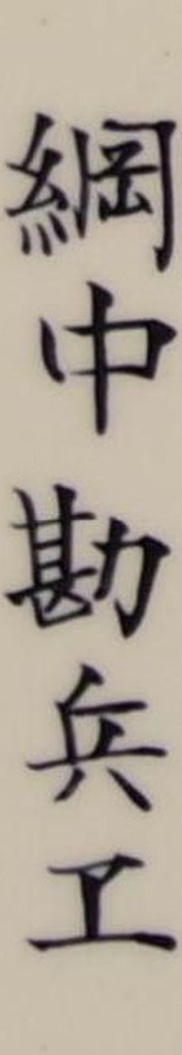綱中勘兵エ
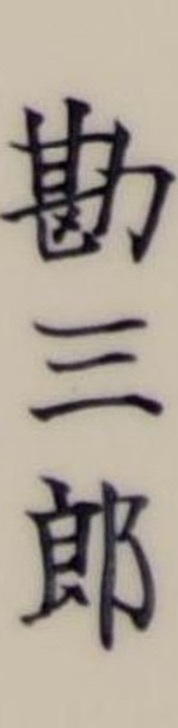勘三郎
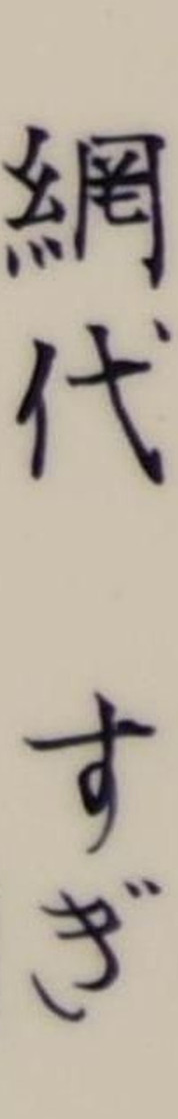網代すぎ
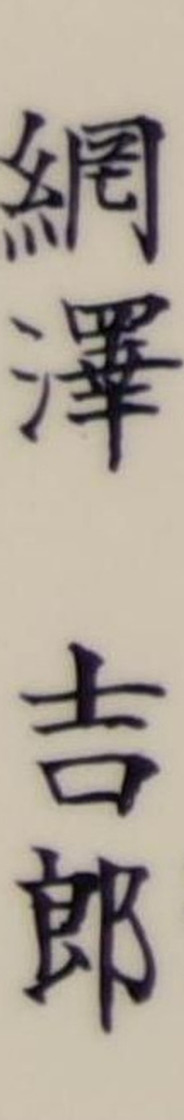網澤吉郎
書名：E~L
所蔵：高野山金剛峯寺
